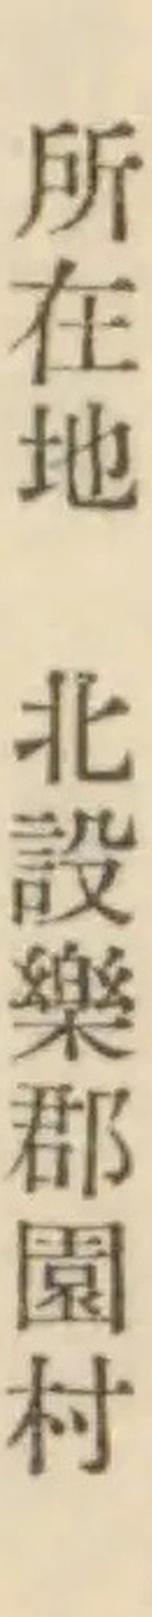所在地北設楽郡園村
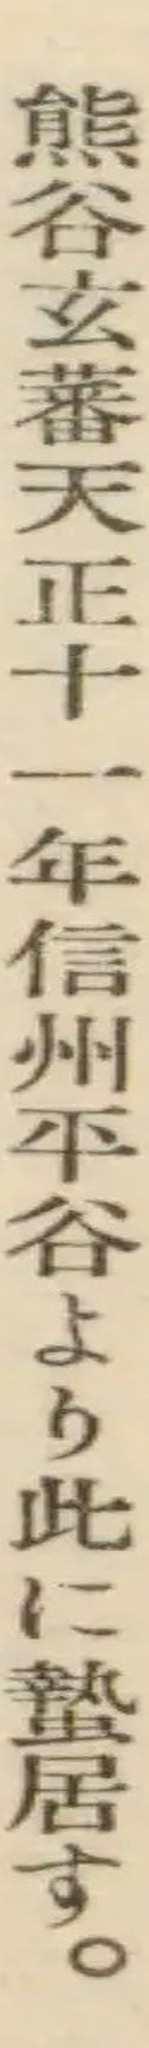熊谷玄蕃天正十一年信州平谷より此に蟄居す。
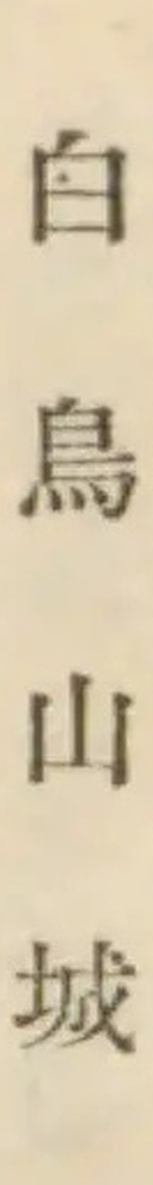白鳥山城
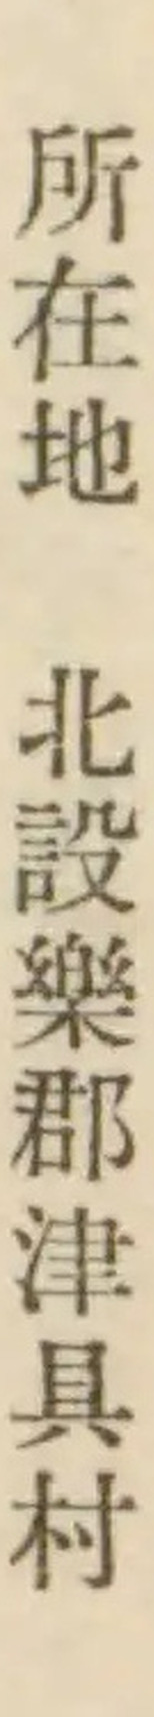所在地北設楽郡津具村
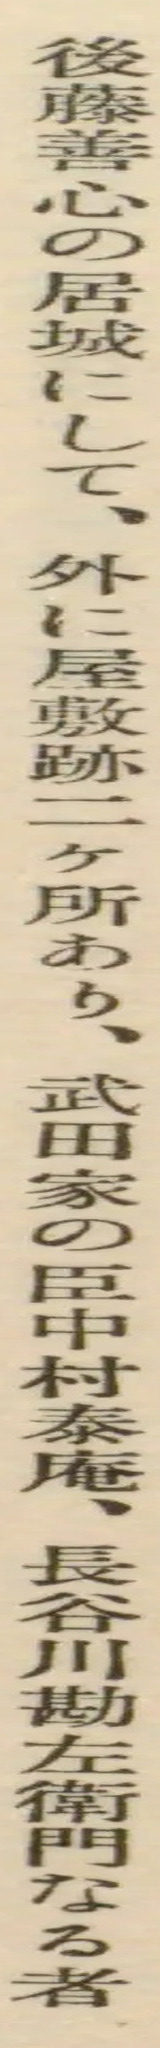後藤善心の居城にして、外に屋敷跡二ケ所あり、武田家の臣中村泰庵、長谷川勘左衛門なる者
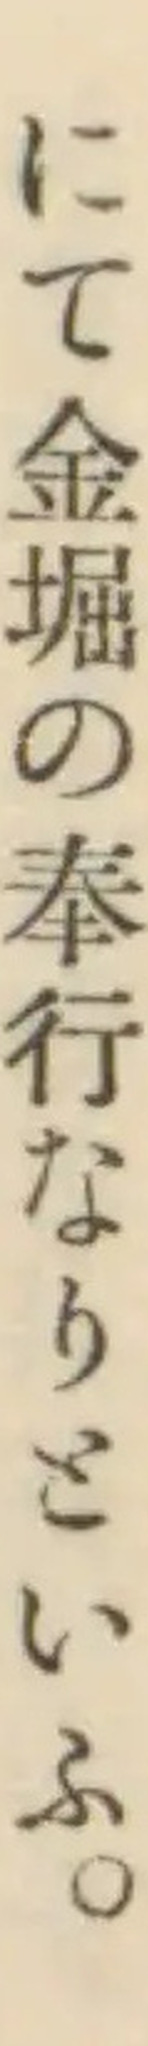にて金堀の奉行なりといふ。
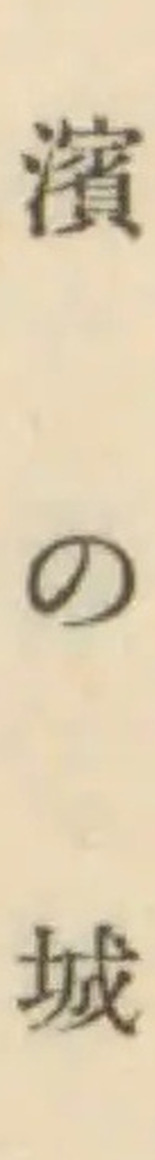浜の城
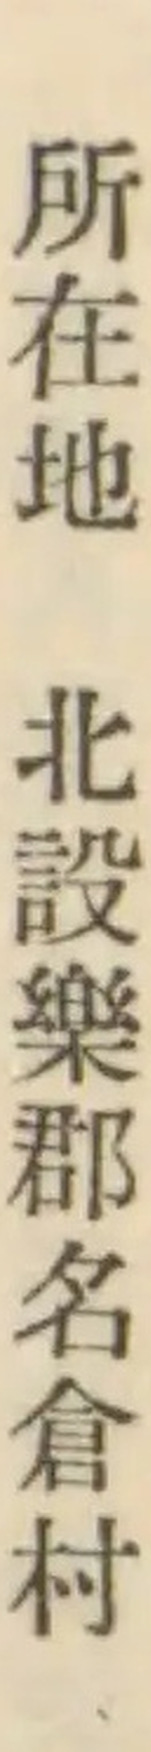所在地北設楽郡名倉村
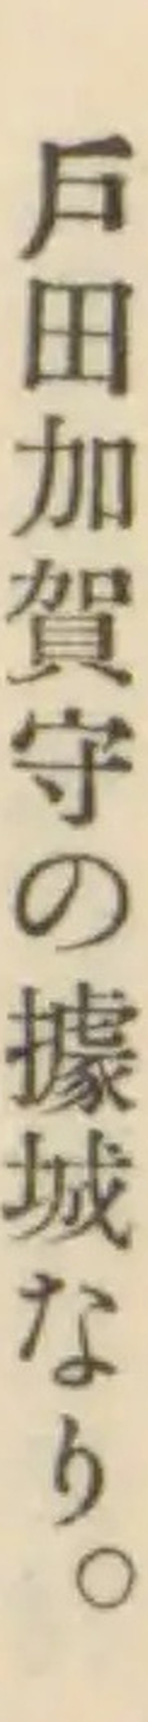戸田加賀守の拠城なり。
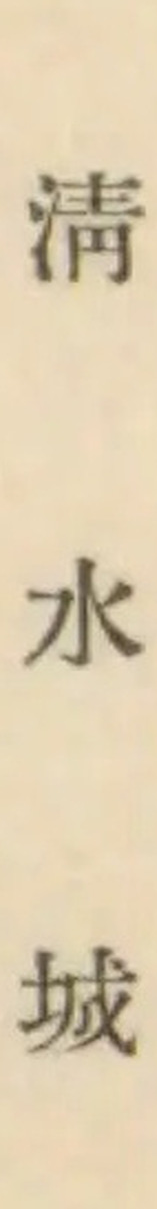清水城
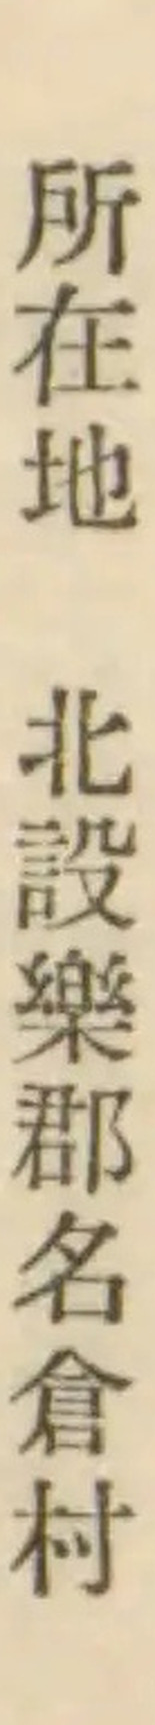所在地北設楽郡名倉村

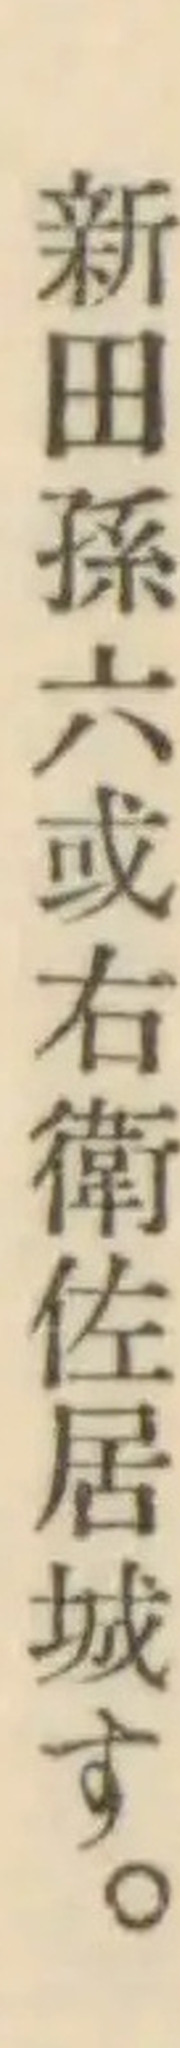新田孫六或右衛佐居城す。
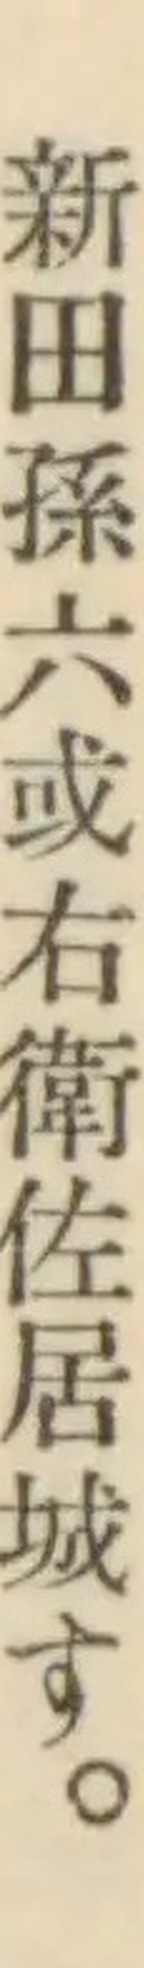新田孫六或右衛佐居城す。
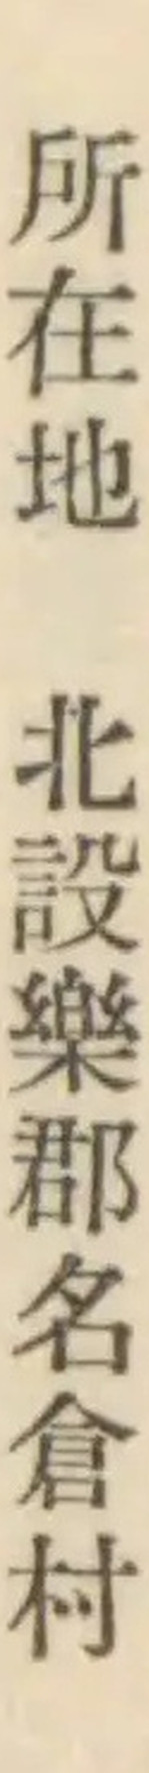所在地北設楽郡名倉村
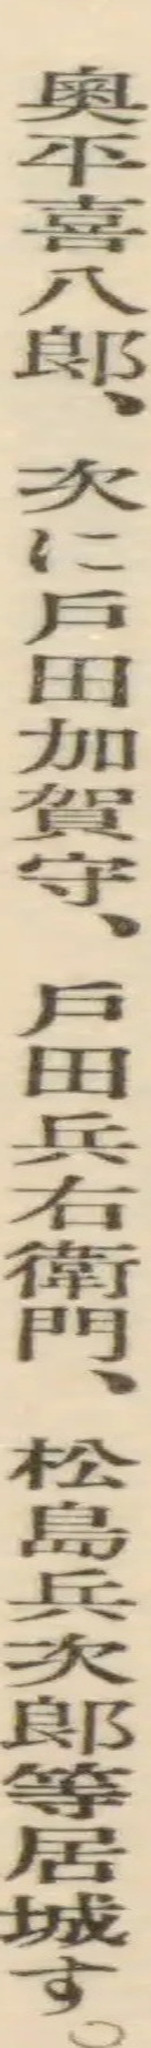奥平喜八郎、次に戸田加賀守、戸田兵右衛門、松島兵次郎等居城す。
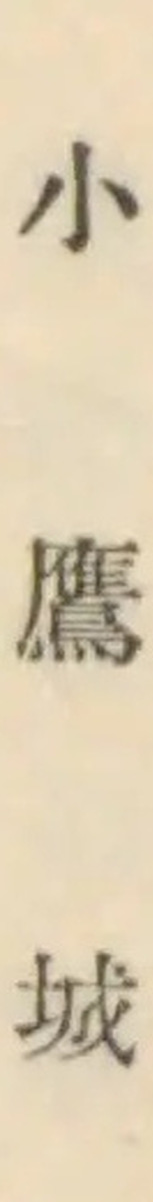小鷹城
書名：東三河之古城
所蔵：国立国会図書館 National Diet Library, JAPAN
